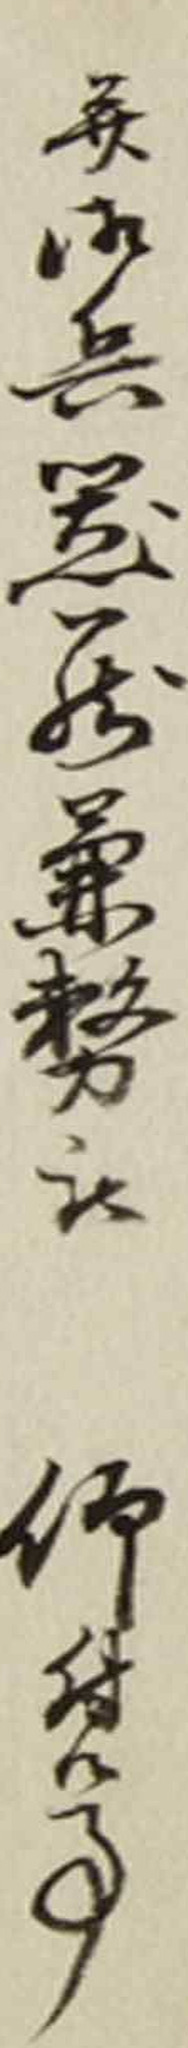并御兵器蔵兼務被仰付候事
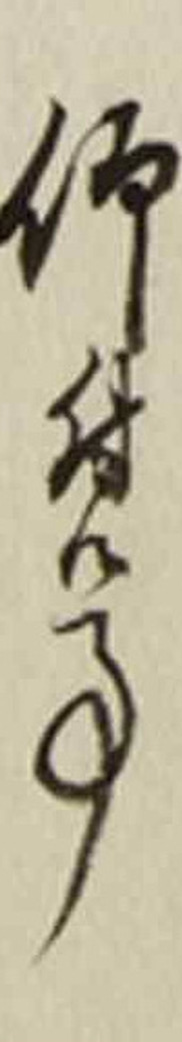仰付候事
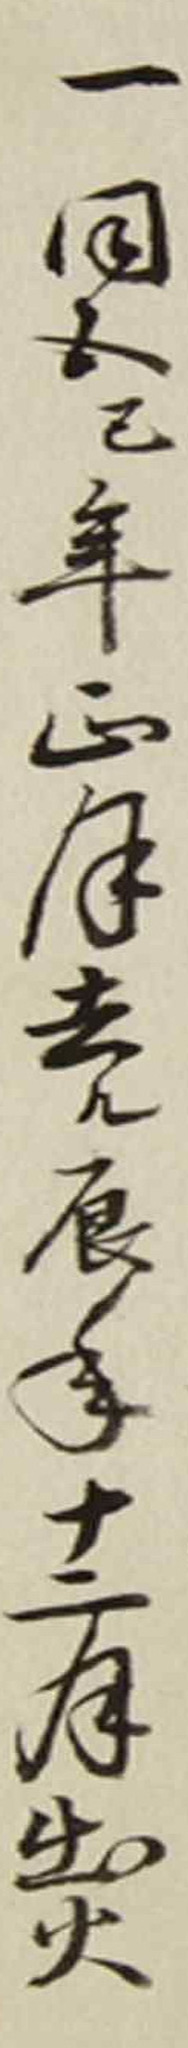一同五巳年正月去ル辰年十二月出火
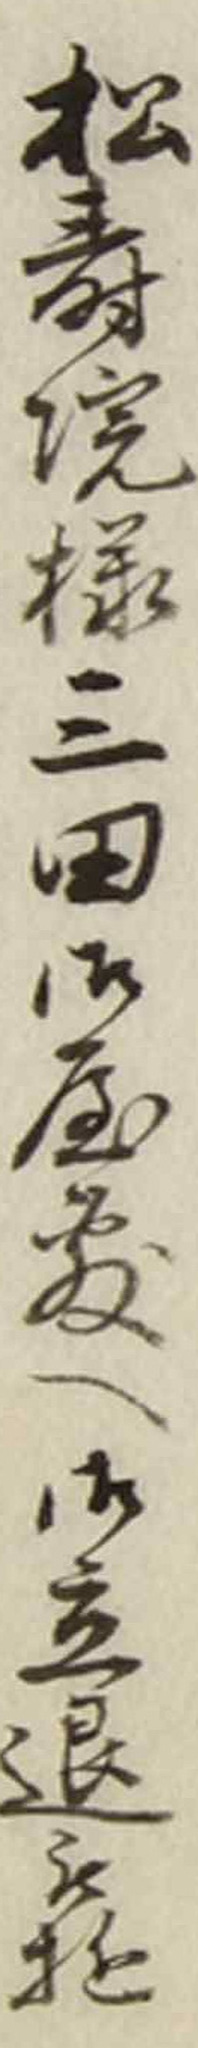松寿院様三田御屋敷へ御立退被遊
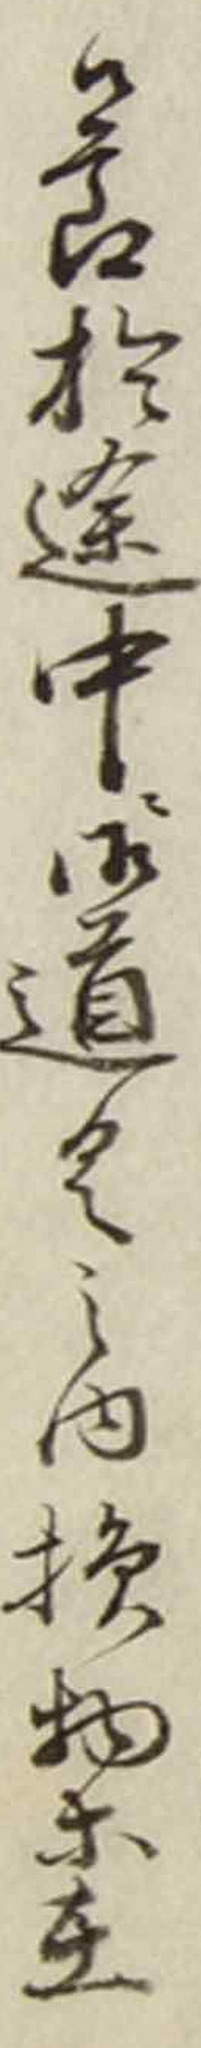候節於途中御道具之内損物等在

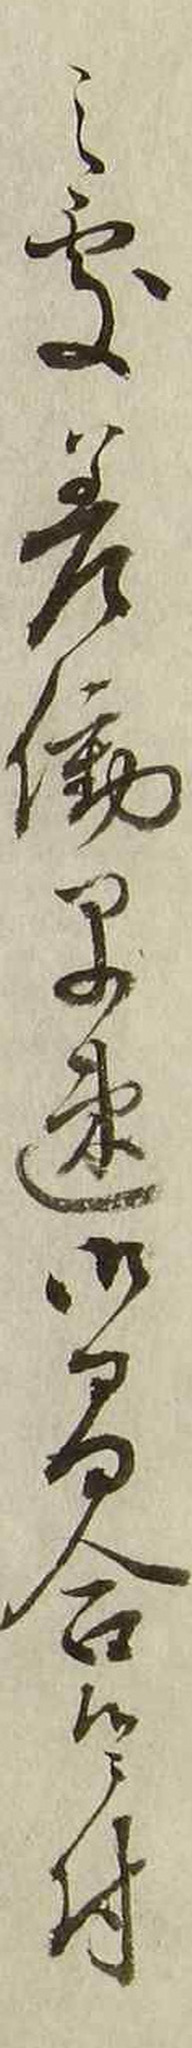之処差働早速御間合候ニ付
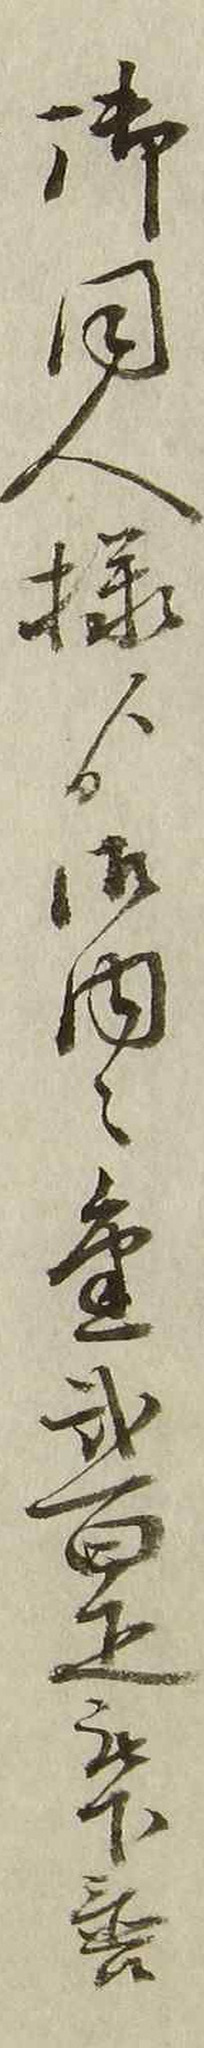御同人様ゟ御内々金弐百疋被下置候
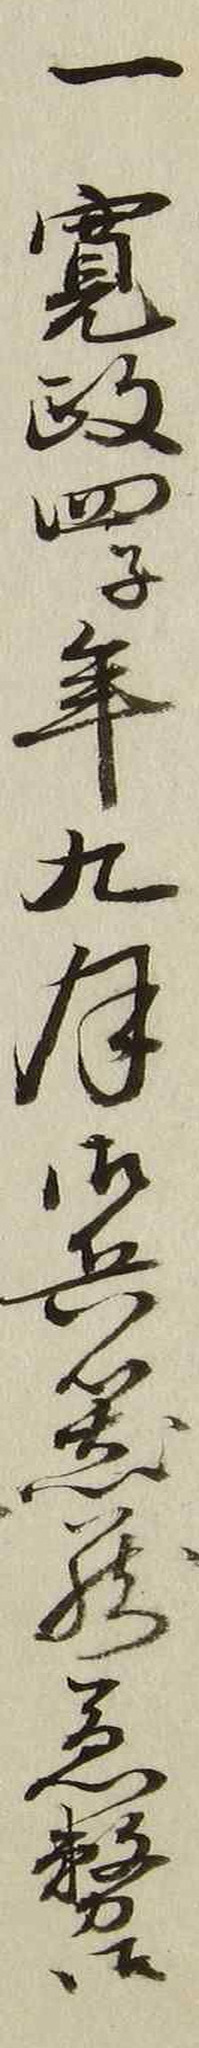一寛政四子年九月御兵器蔵兼務御
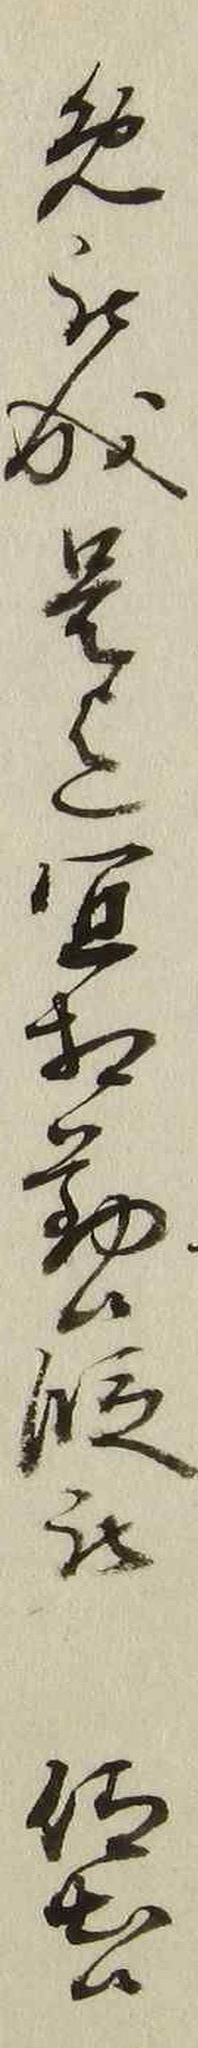免被成是迄宜相勤候段被仰出候
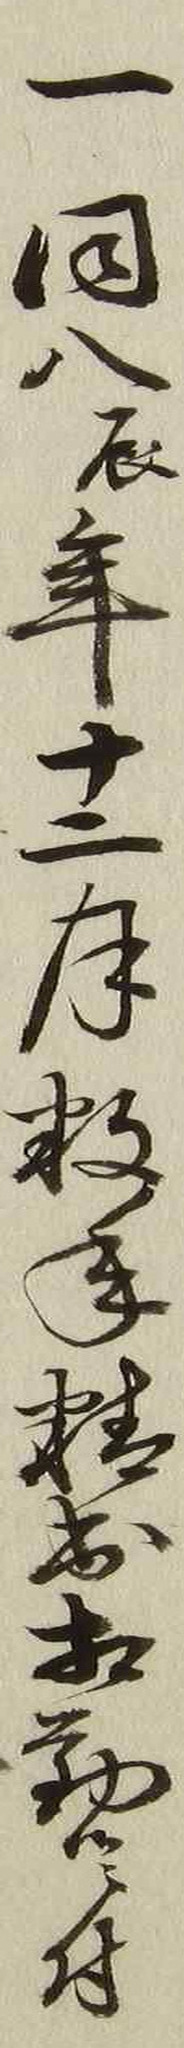一同八辰年十二月数年精出相勤候ニ付
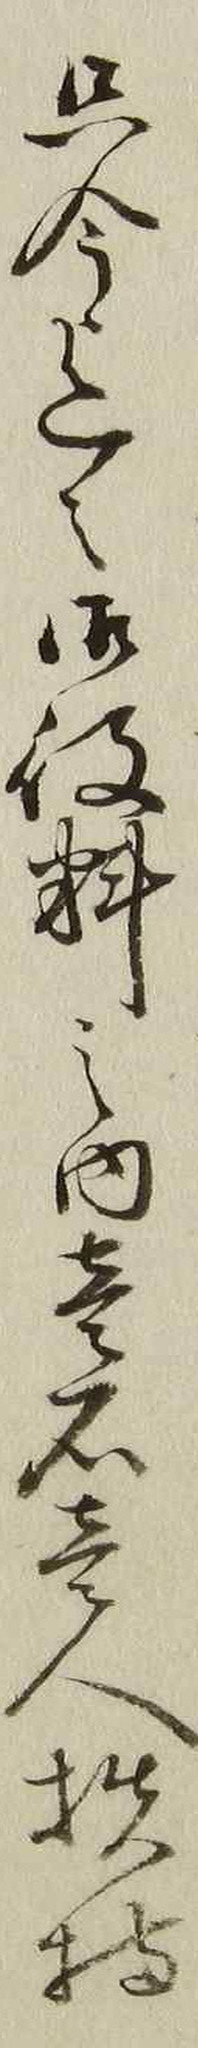只今迄之御役料之内壱石壱人扶持
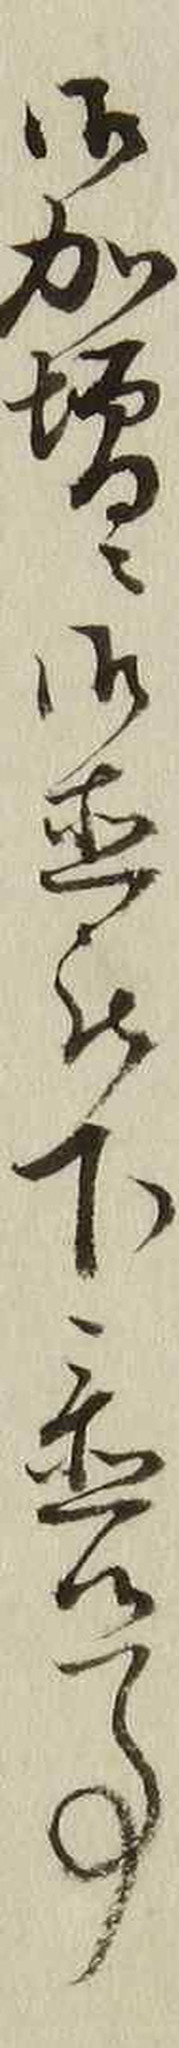御加増ニ御直被下置候事
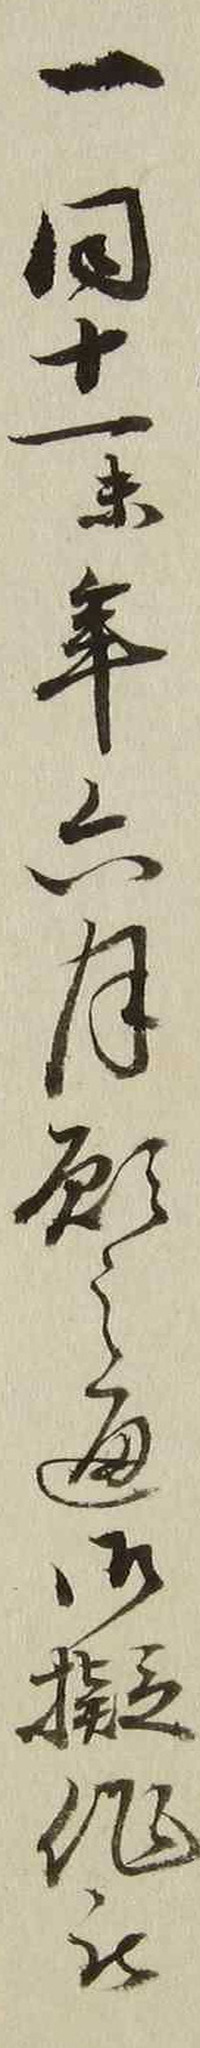一同十一未年六月願之通御擬作被
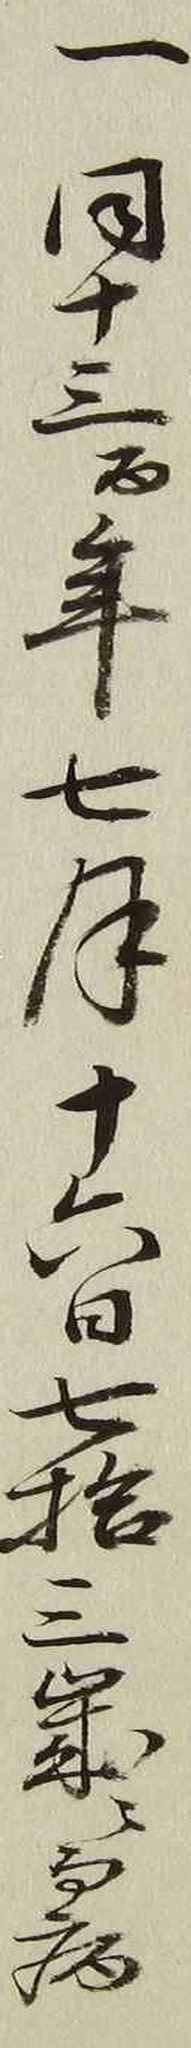一同十三酉年七月十六日七拾三歳ニ而病
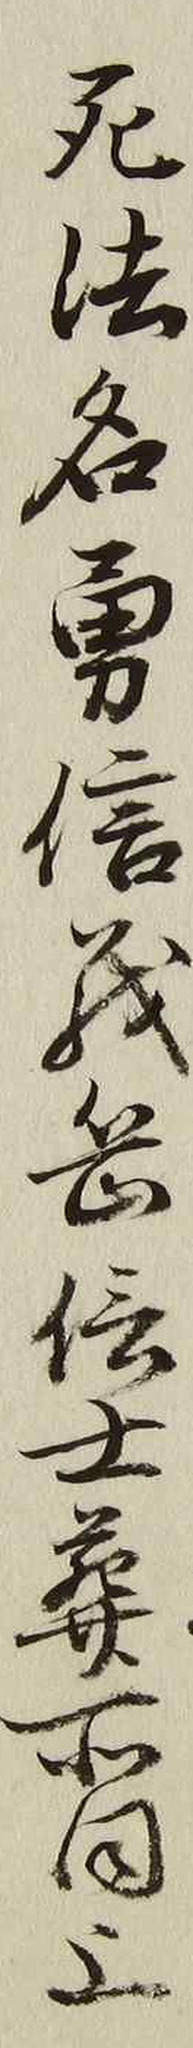死法名勇信義岳信士葬所同上
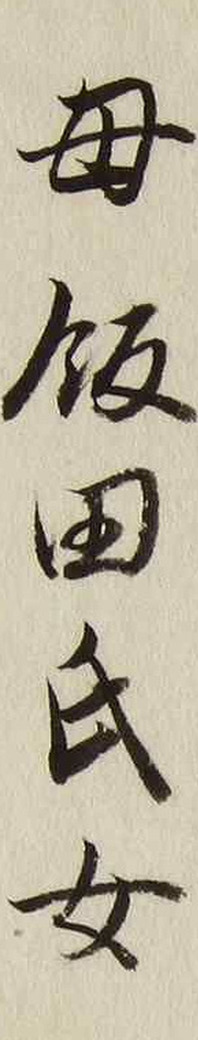母飯田氏女
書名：諸士系譜　巻之39　は之部7
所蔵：会津若松市立会津図書館
